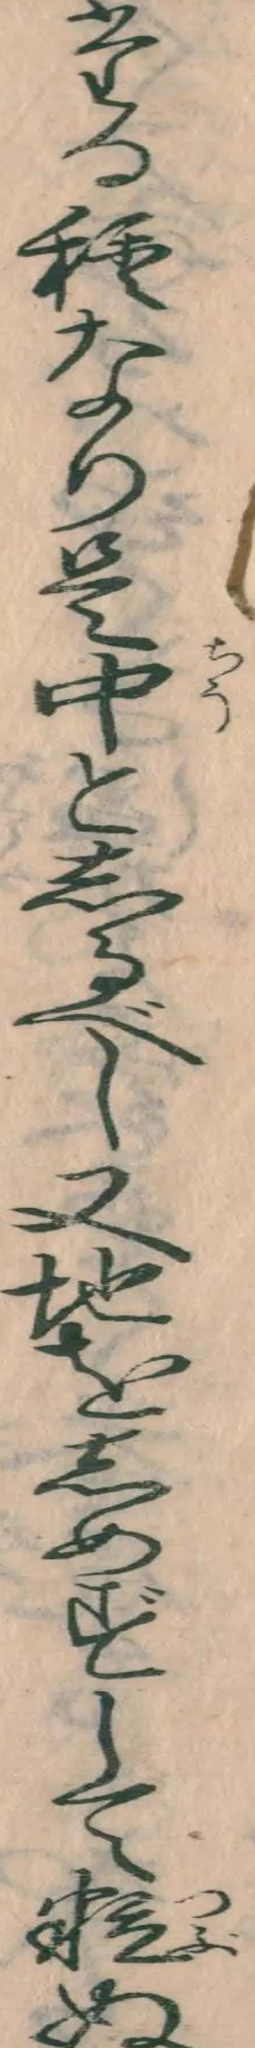たる種なり是中としるべし又地をしめずして粒ぬ
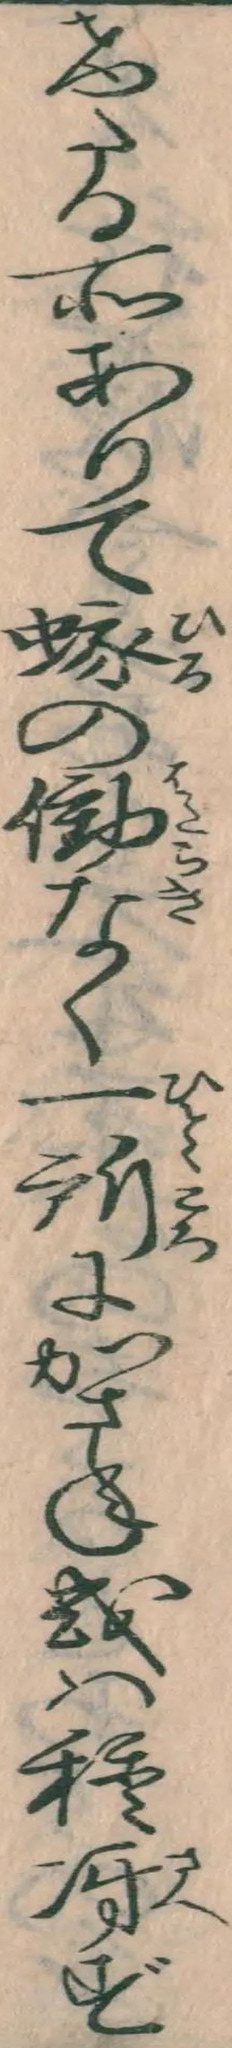けたる所ありて蝝の働なく一所にかさね或は種冴ず
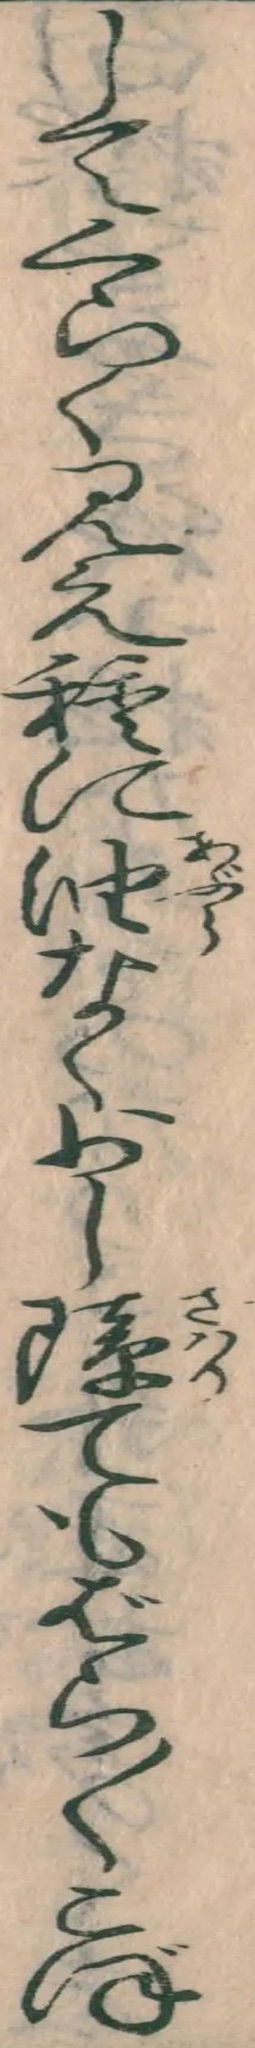してくらく見え種に油なく少し障てもばら〳〵こぼ
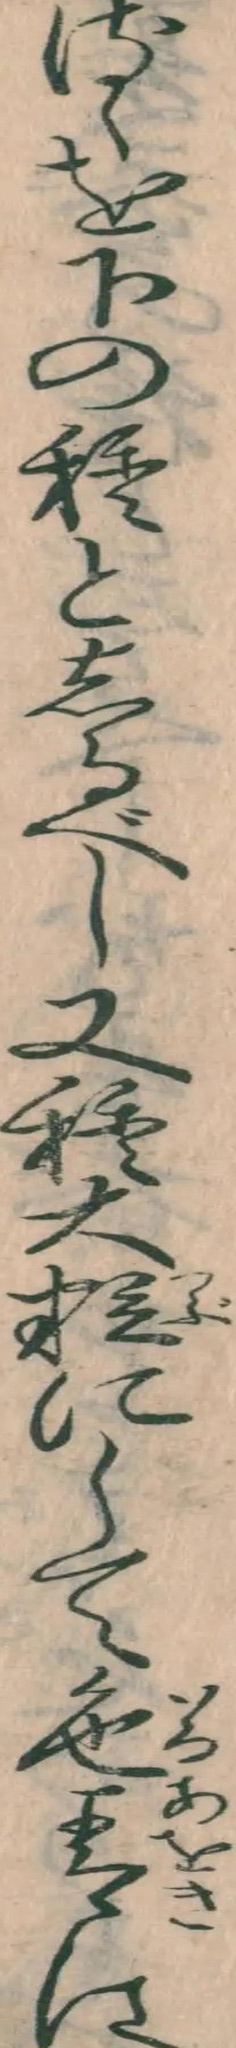るゝを下の種としるべし又種大粒にして色青は

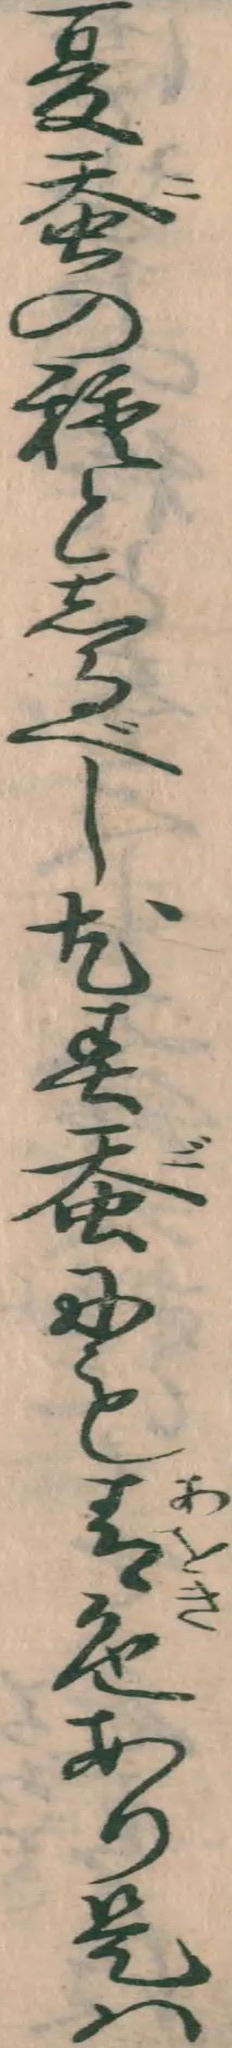夏蚕の種としるべし尤春蚕にも青色あり是は
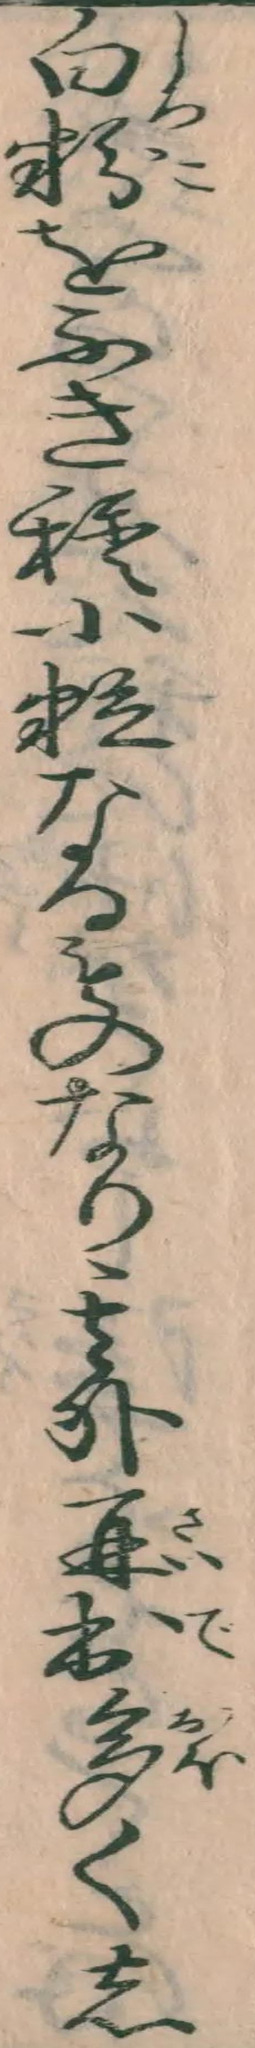白粉をふき種小粒なるものなり其外再出多くし
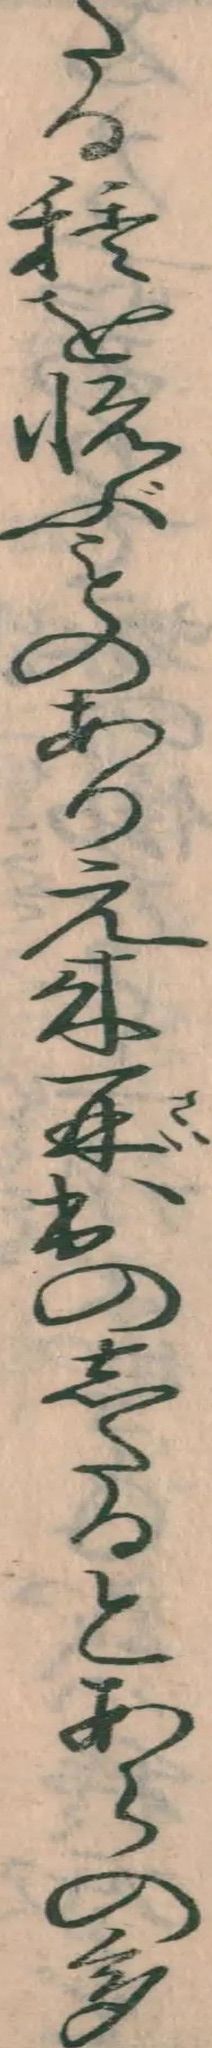たる種を悦ぶものあり元来再出のしたるとあらの多
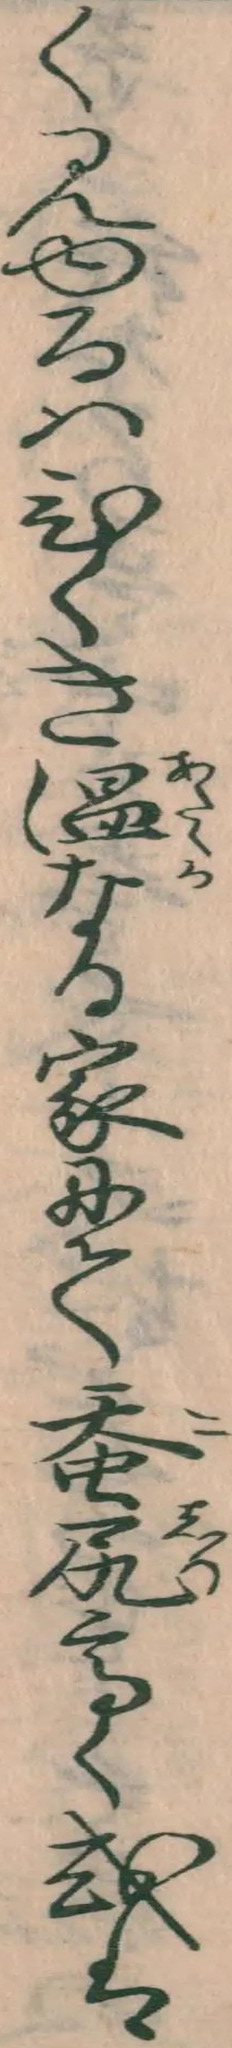く見ゆるはひくき温なる家にて蚕尻高く或は
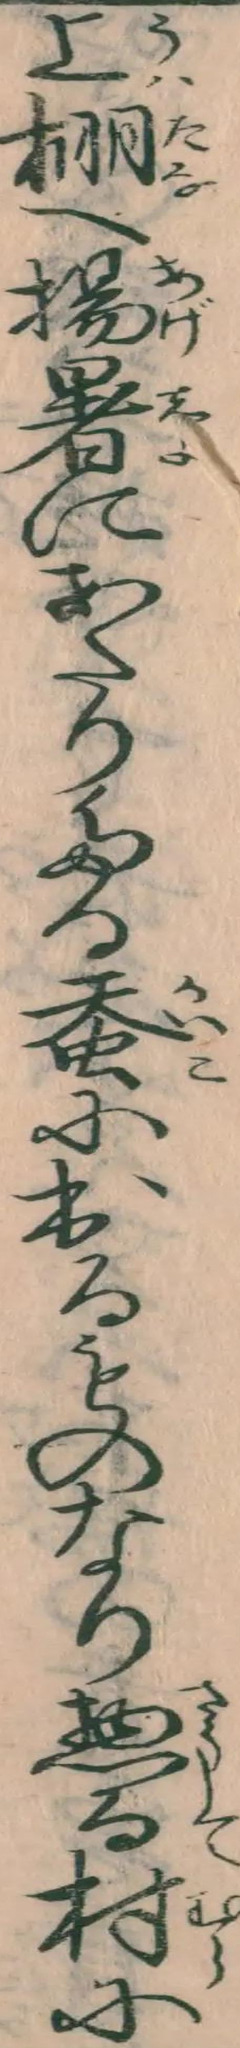上棚へ揚暑にあたりたる蚕に出るものなり惣而村に
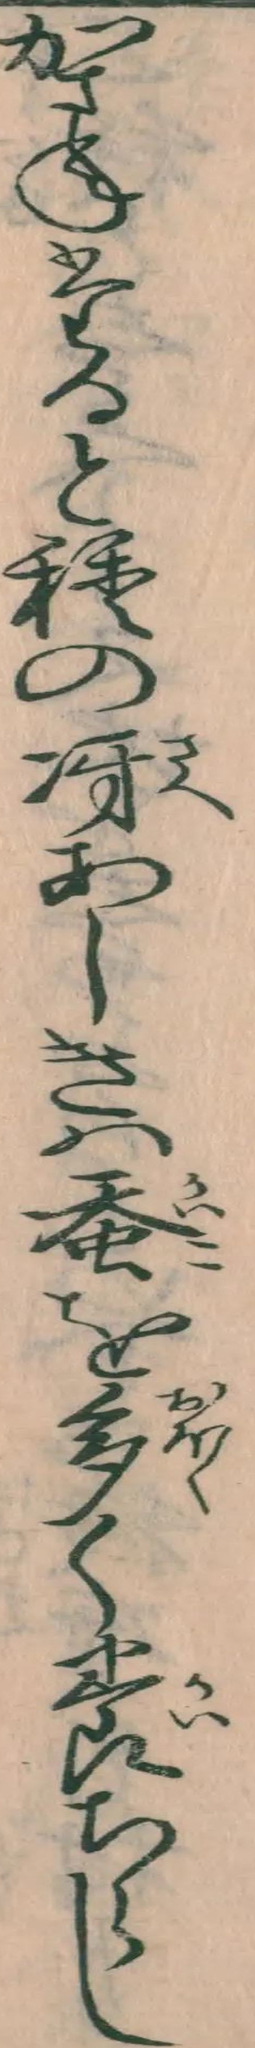かさねたると種の冴あしきは蚕を多く養ちらし
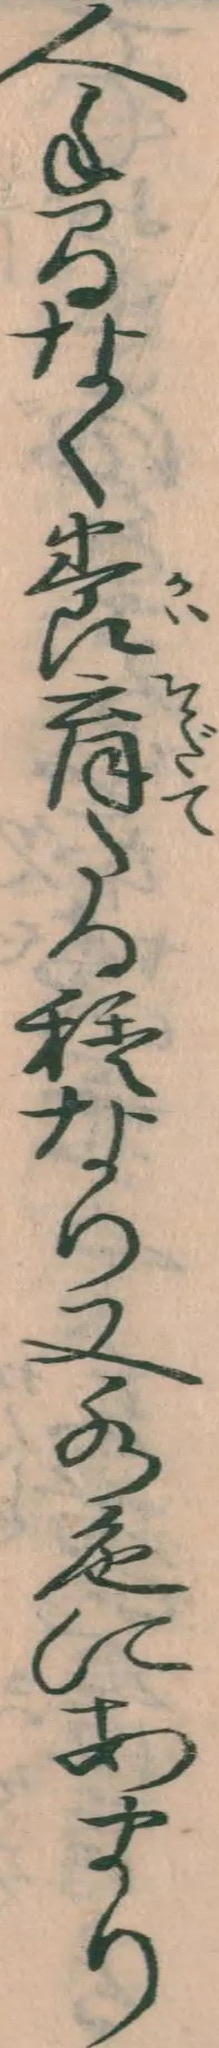人手間なく養育たる種なり又水色にあまり
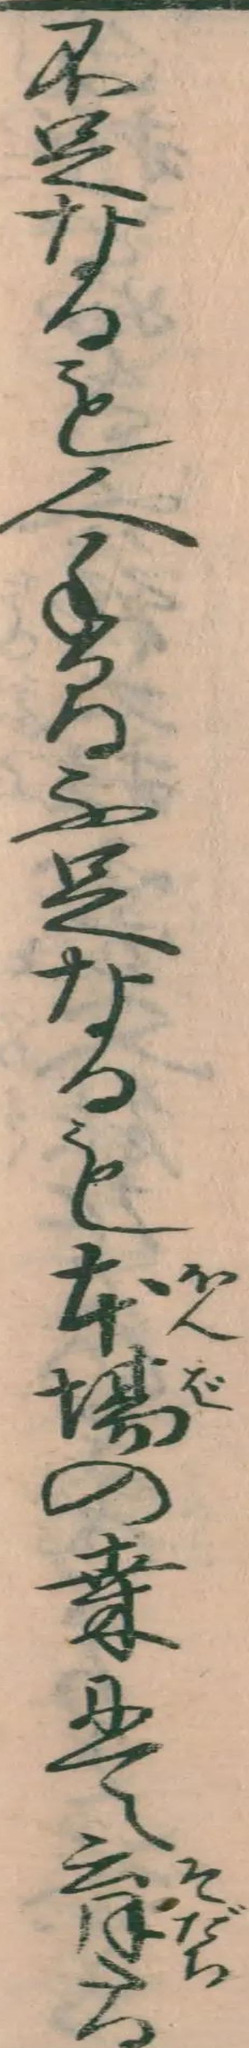不足なるも人手間不足なるも本場の桑にて育たる
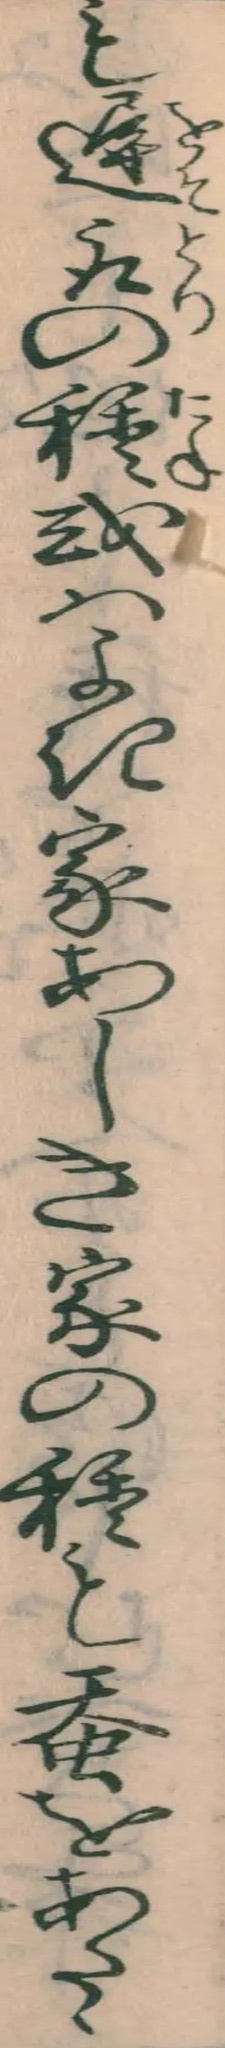も遅取の種或はよき家あしき家の種も蚕をあたゝ
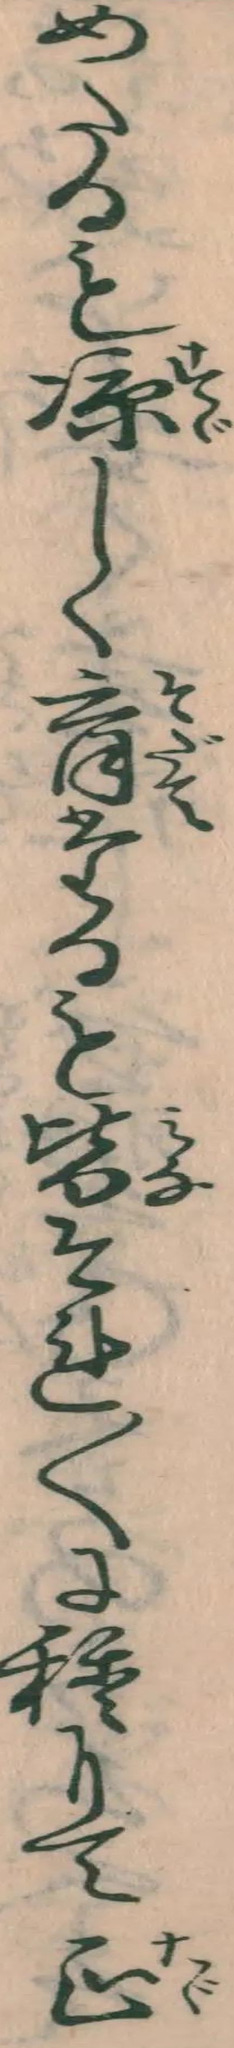めたるも涼しく育たるも皆それ〳〵に種にて正
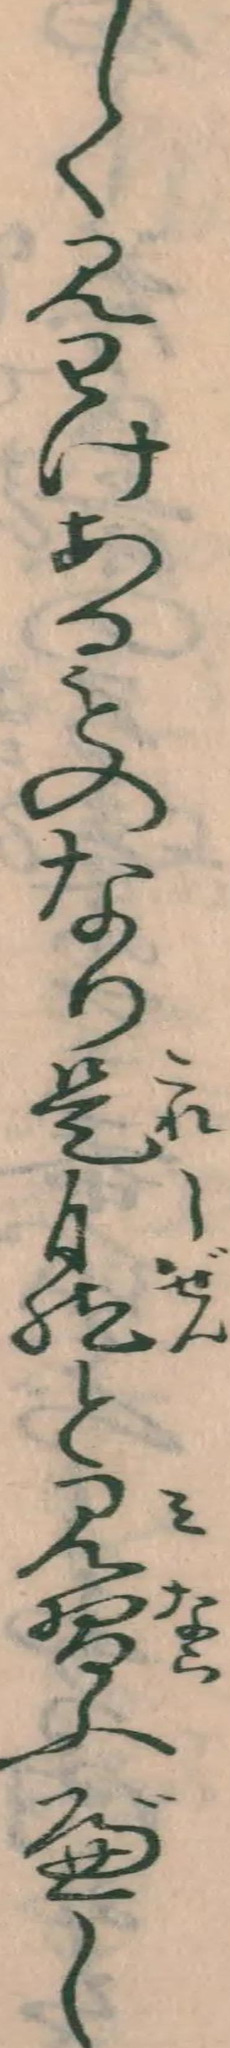しく見わけあるものなり是自然と見習ふべし
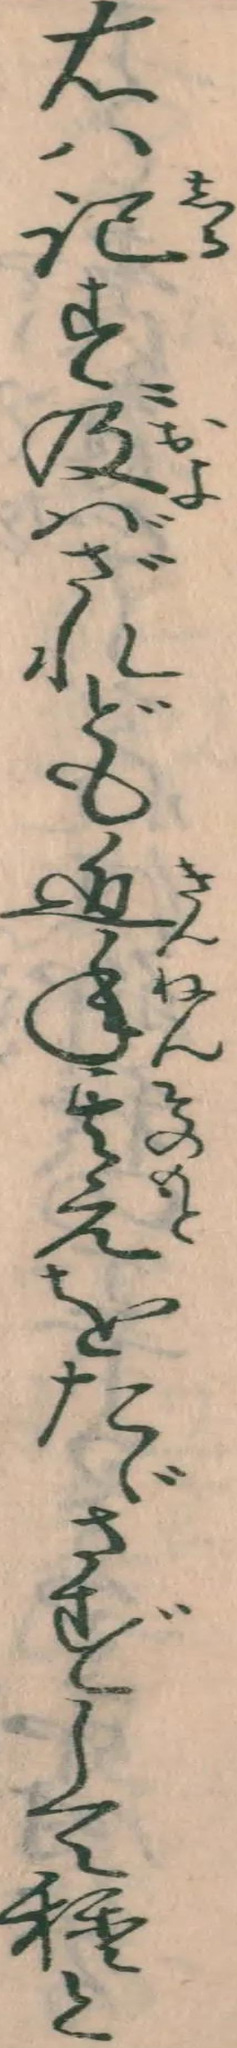右は記すに及ばざれども近年其元をたゞさずして種と
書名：新撰養蚕秘書
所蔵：国立国会図書館 National Diet Library, JAPAN
